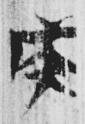侯
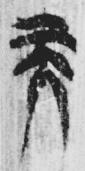天
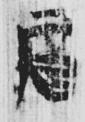𨟻（將）
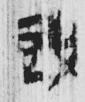○（誅）
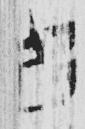𡚦（焉）
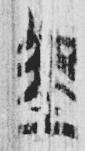○（吾）
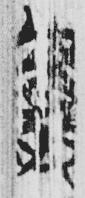○（勴）
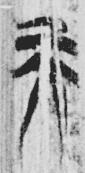天
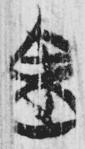畏（威）
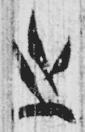之
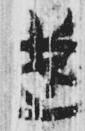武
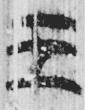王
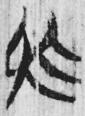於
